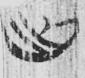出
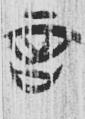言
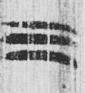三
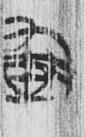軍
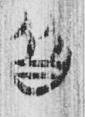皆
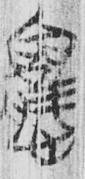懽
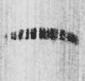一
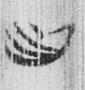出
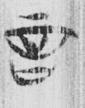言
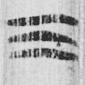三
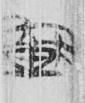軍
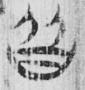皆
